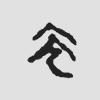亢
